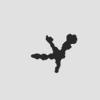又
